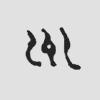州
